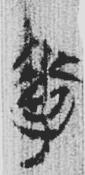季
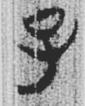子
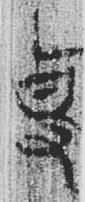○（使）
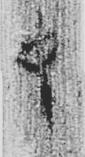中（仲）
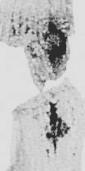弓
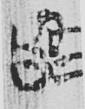爲
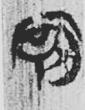○（宰）
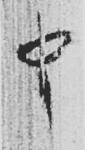中（仲）
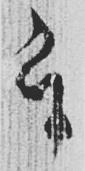弓
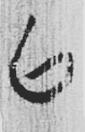㠯（以）
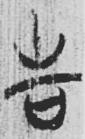告
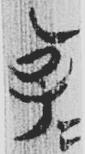孔子
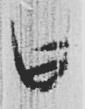曰
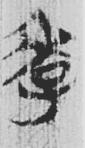季
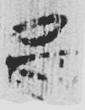是（氏）
